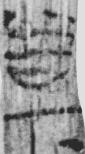甚
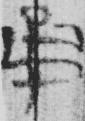甬（用）
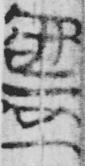○（智）
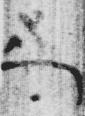之
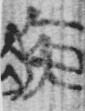疾
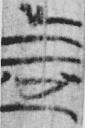者
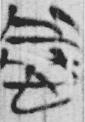惓（患）
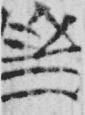爲
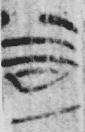甚
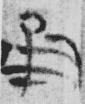甬（用）
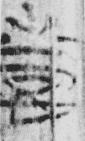情
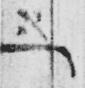之
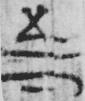至
